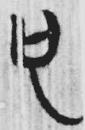也
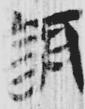○（聞）
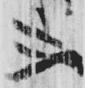之
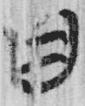曰
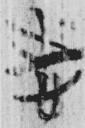志
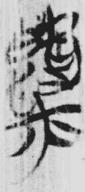○（氣）
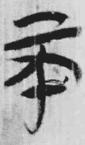不
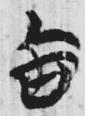旨
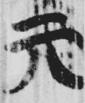亓（其）
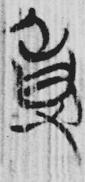事
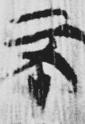不
